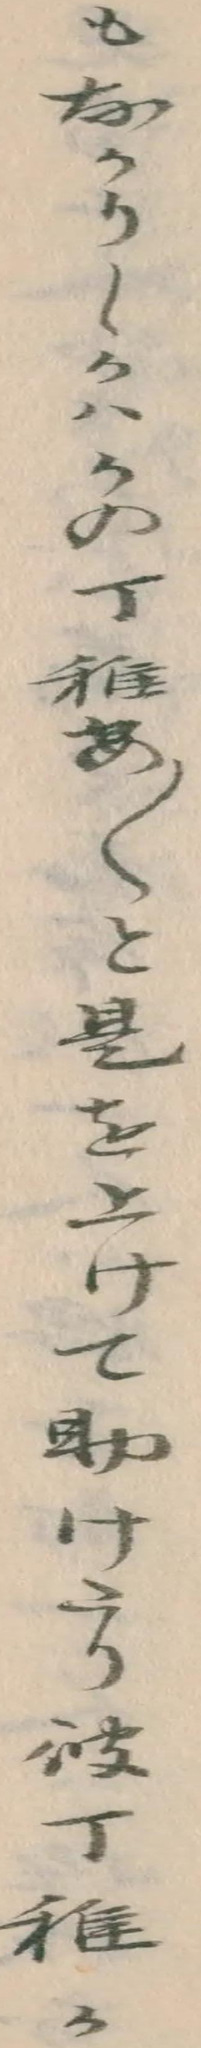もなかりしかはかの丁稚安〳〵と是を上けて助たり彼丁稚か
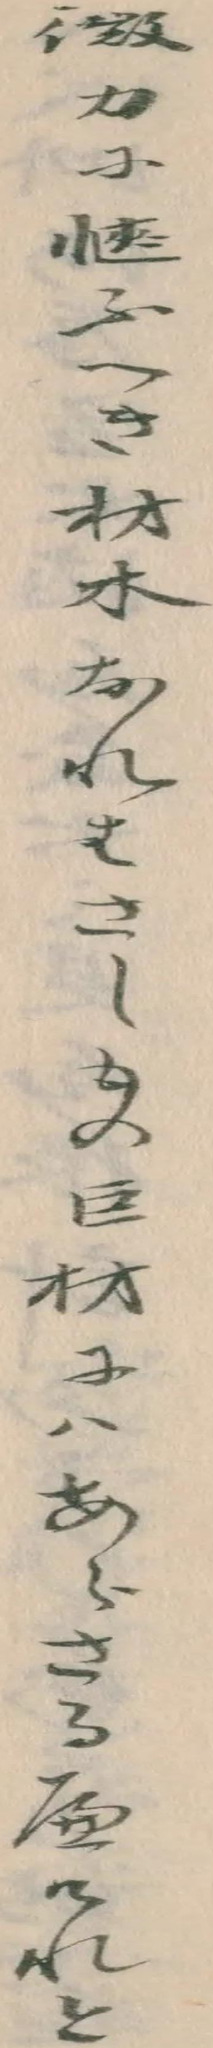微力に愜ふへき材木なれはさしもの巨材にはあらさるへけれと
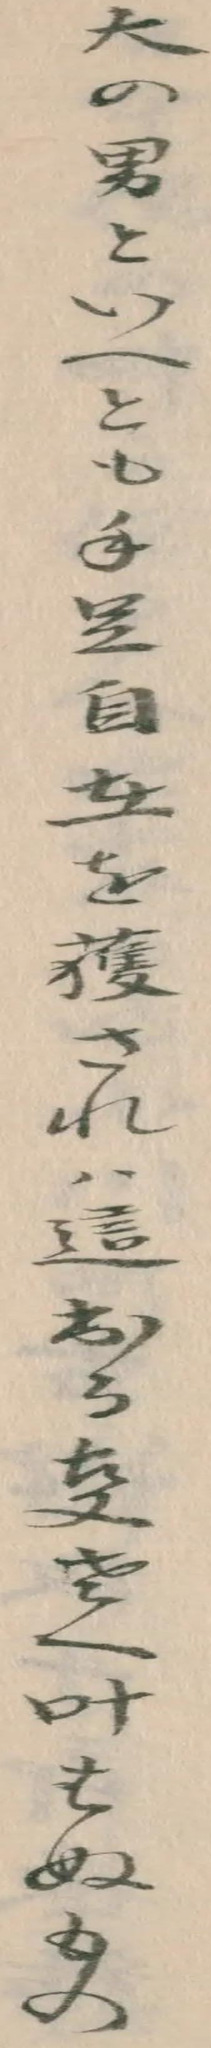大の男といへとも手足自在を獲されは這出る事さへ叶はぬもの
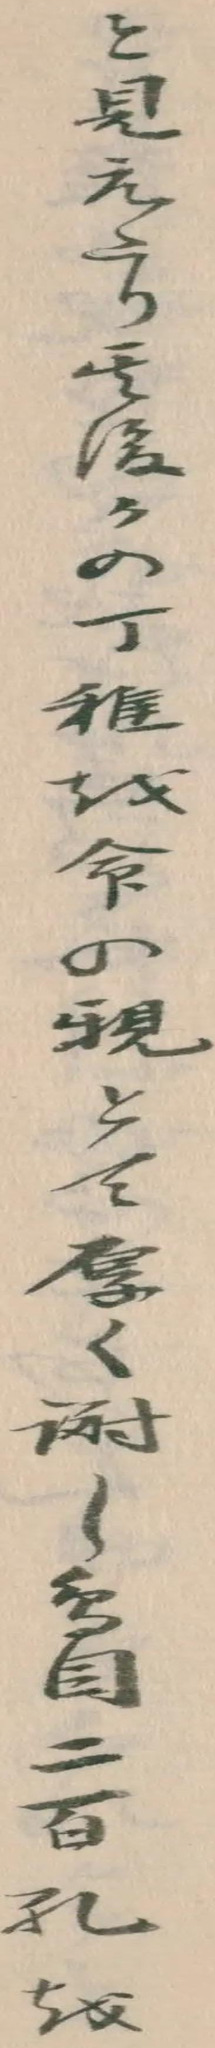と見えたり其後かの丁稚を命の親とて厚く謝し鳥目二百孔を
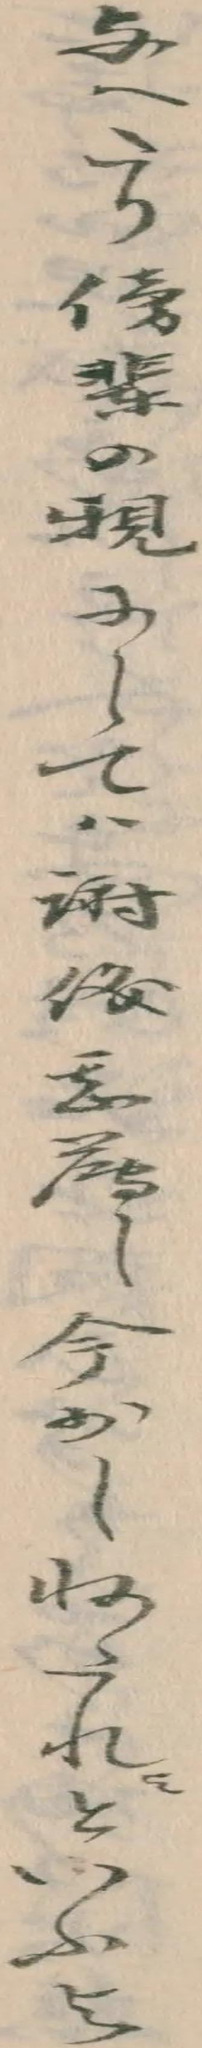与へたり傍輩の親にしては謝儀甚薄し今少し収たれよといふよ
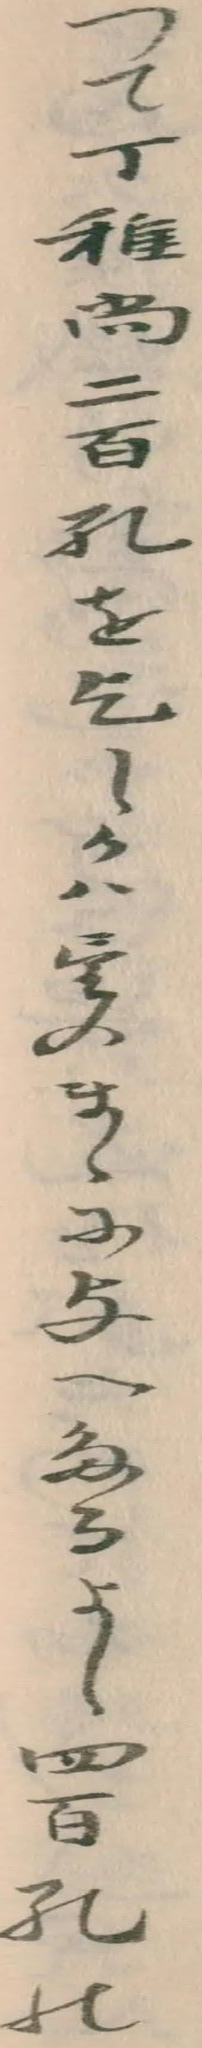つて丁稚尚二百孔を乞しかは望のまゝに与へたるよし四百孔の
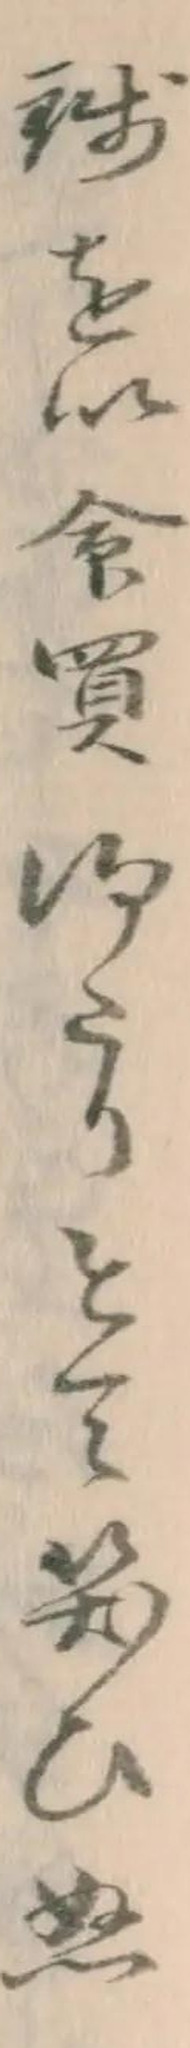銭を以命買得たりとて笑ひぬ
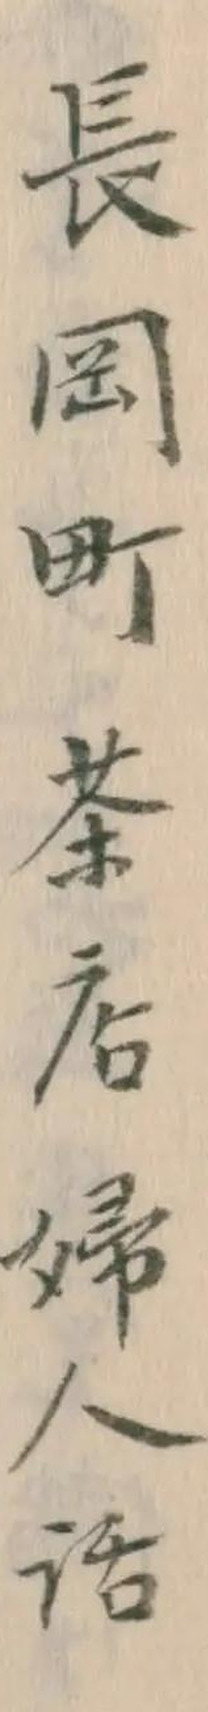長岡町茶店婦人話
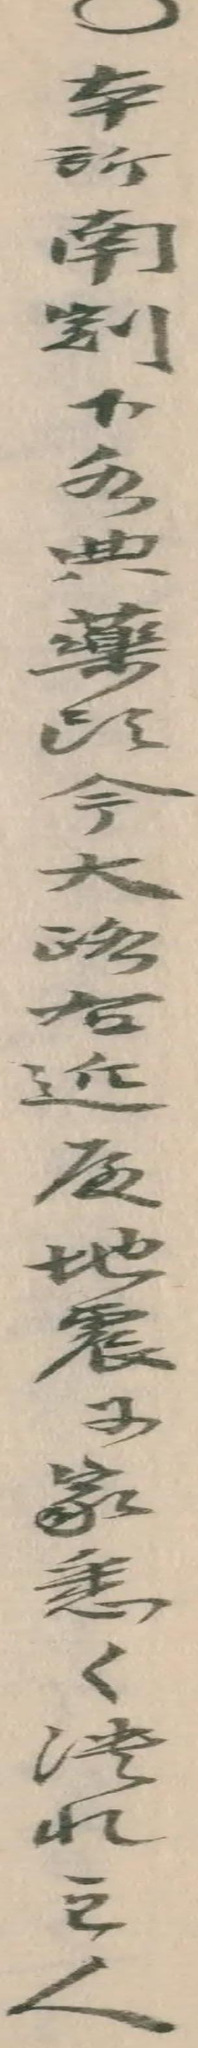〇本所南割下水典薬頭今大路右近殿地震に家悉く潰れ主人
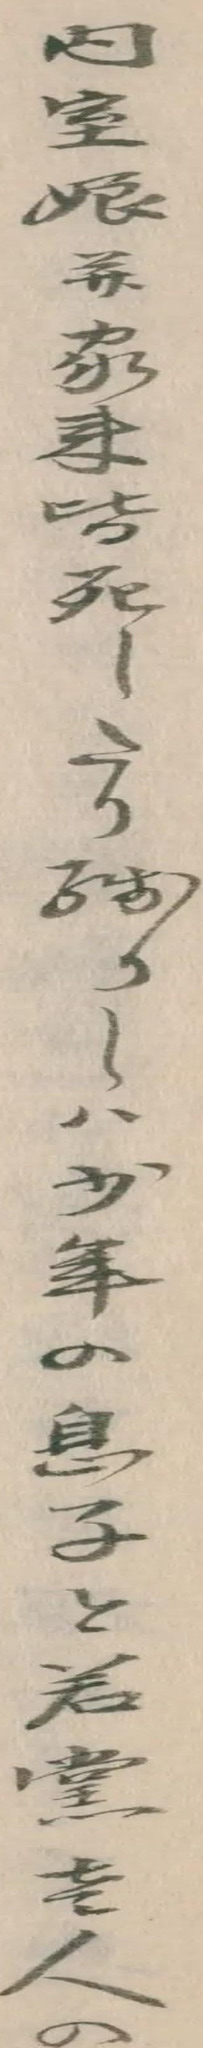内室娘并家来皆死したり残りしは少年の息子と若党壱人の
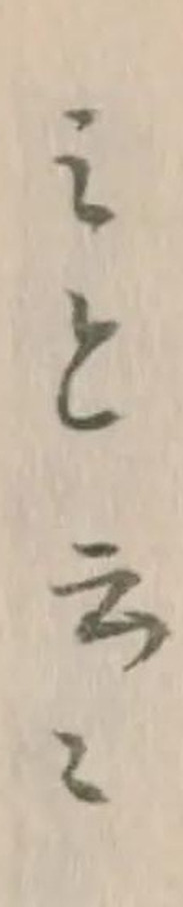みと云々
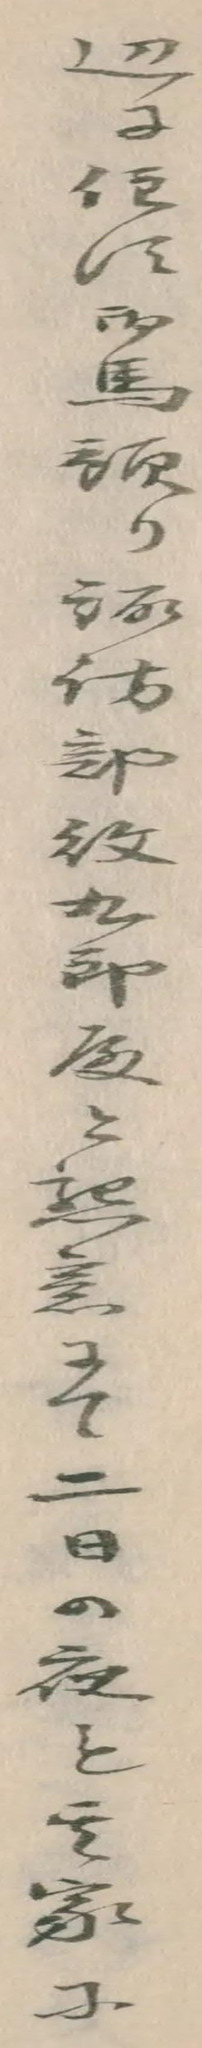辺に住す御馬預り諏訪部紋九郎殿と懇意にて二日の夜も其家に

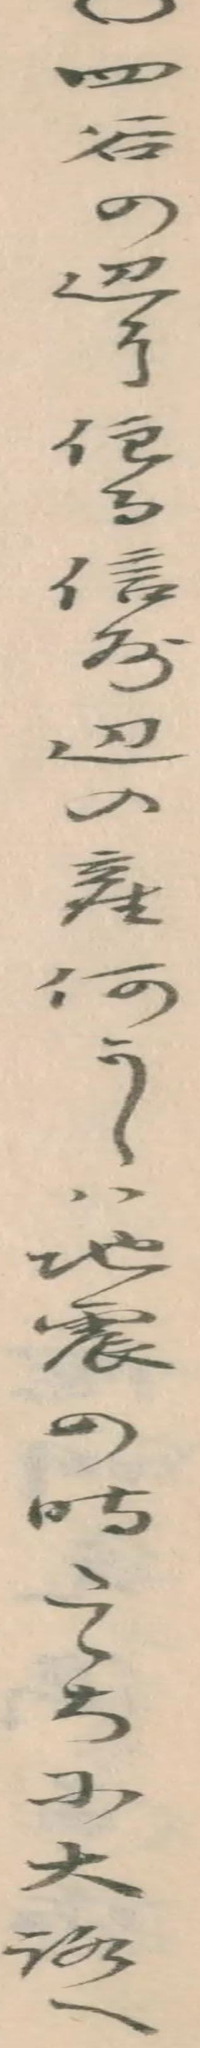〇四谷の辺に住る信州辺の産何かしは地震の時たゝちに大路へ
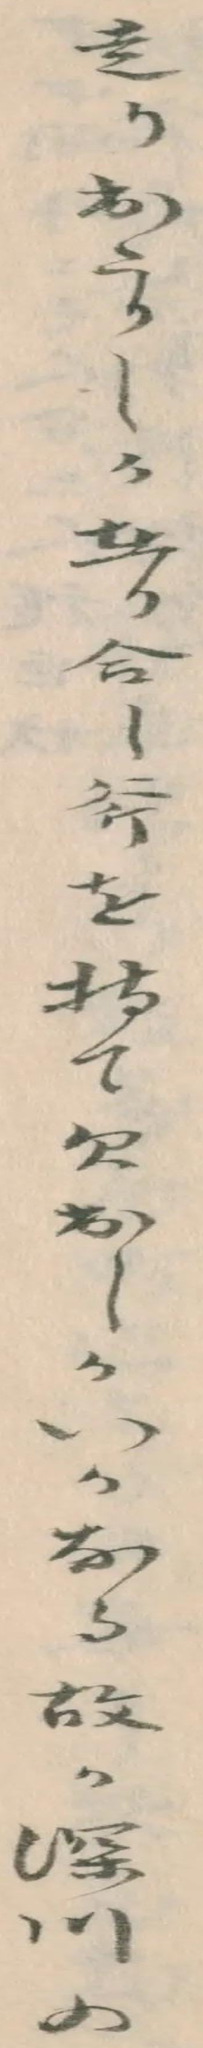走り出たりしか在り合し斧を持て欠出しかいかなる故か深川の
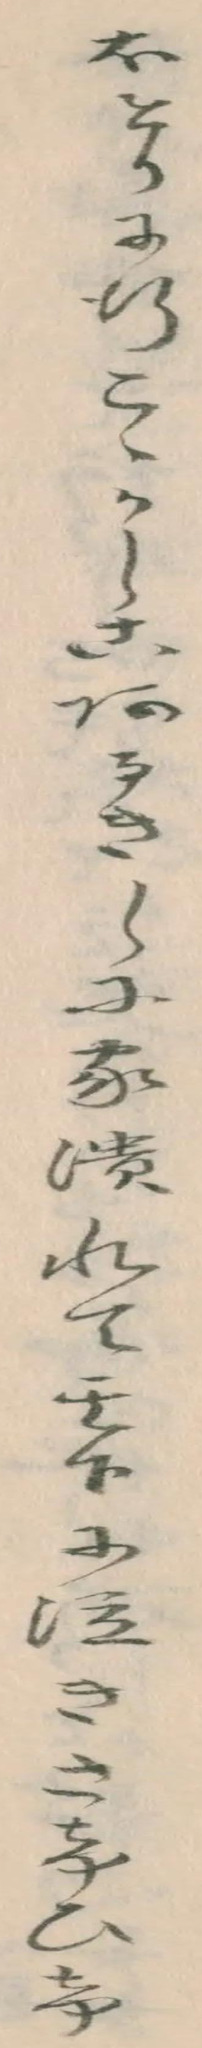ほとりに行こゝかしこあるきしに家潰れて其下に泣きさけひけ
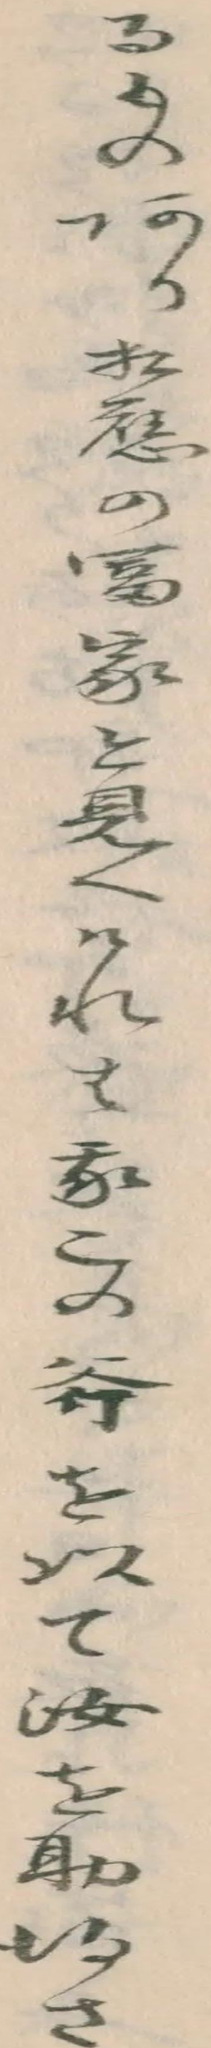るものあり相応の冨家と見へけれは我この斧を以て汝を助得さ
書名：地災撮要. 巻7-9(地震之部)
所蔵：国立国会図書館 National Diet Library, JAPAN
